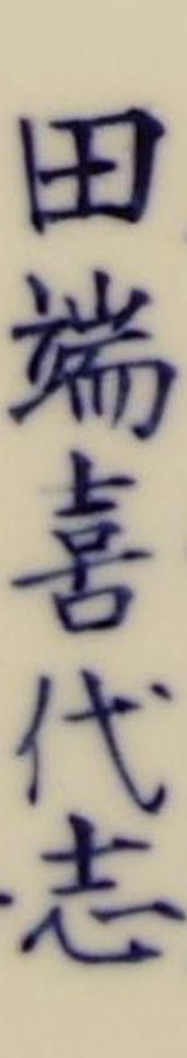田端喜代志
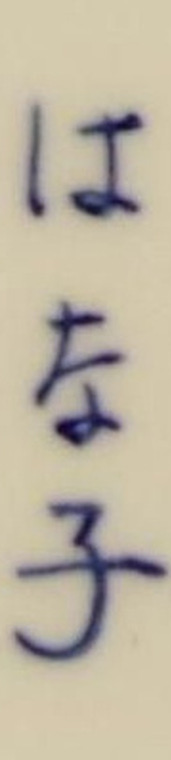はな子
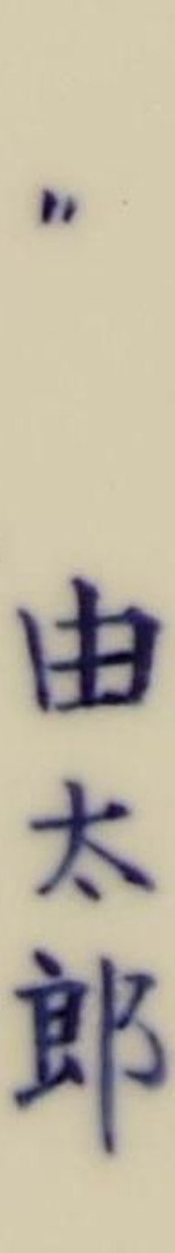由太郎
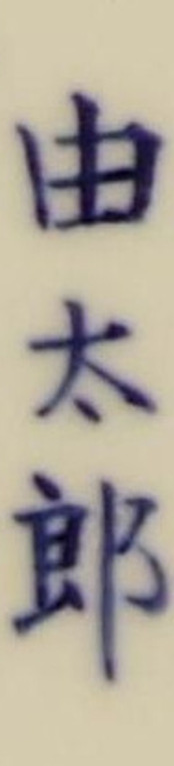由太郎
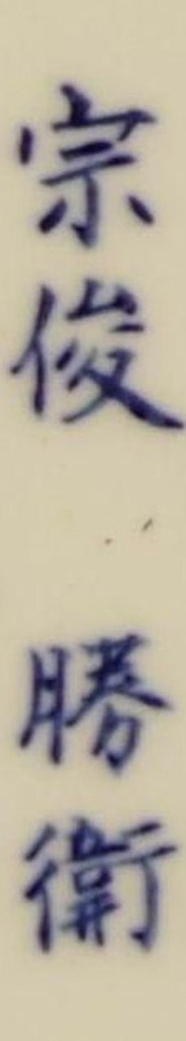宗俊勝衛
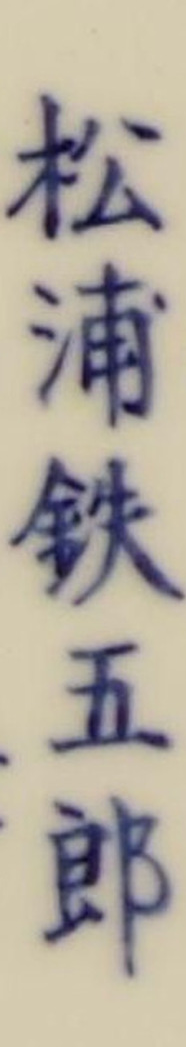松浦鉄五郎
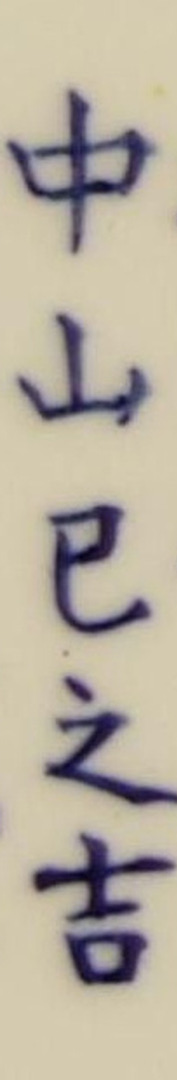中山巳之吉
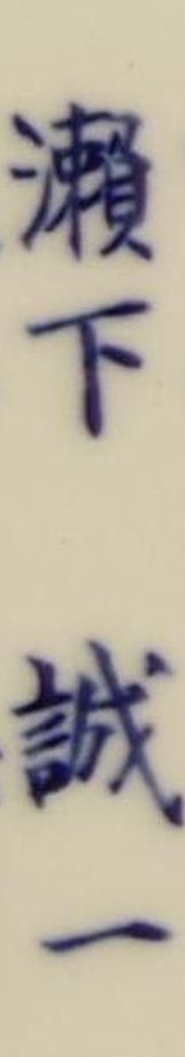瀬下誠一
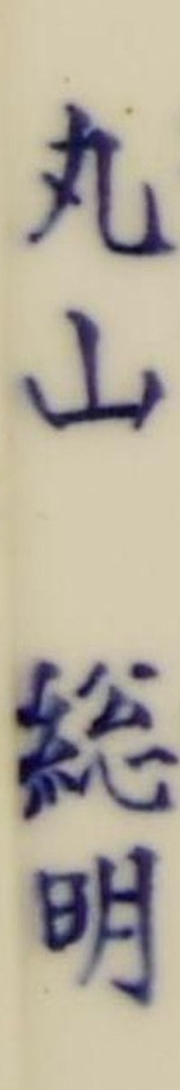丸山総明

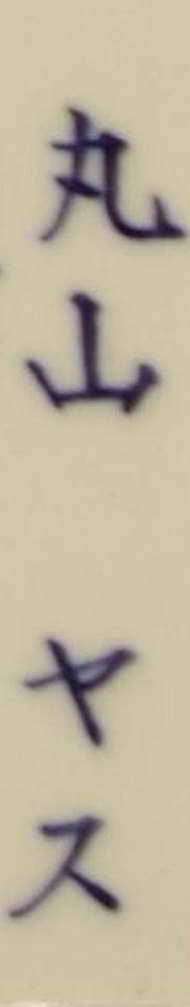丸山ヤス
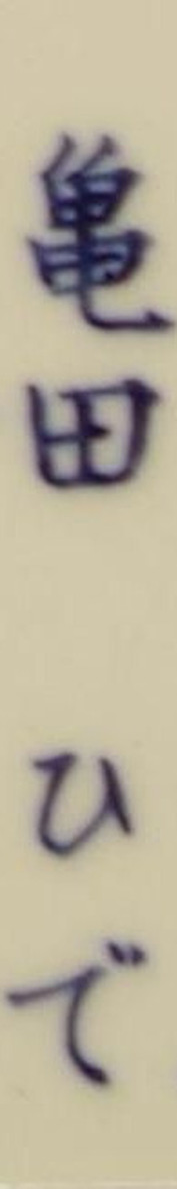亀田ひで
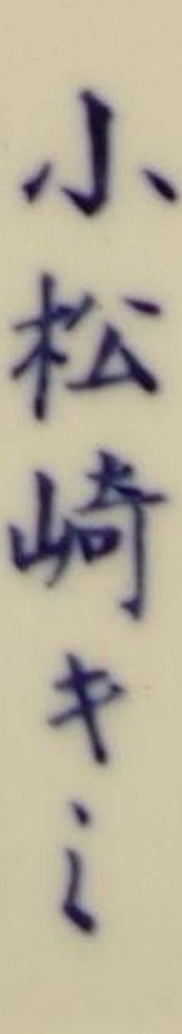小松崎キミ
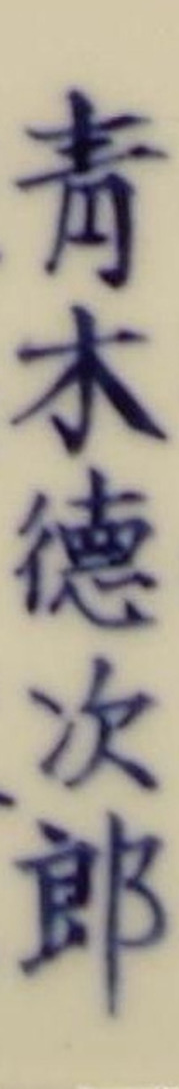青木徳次郎
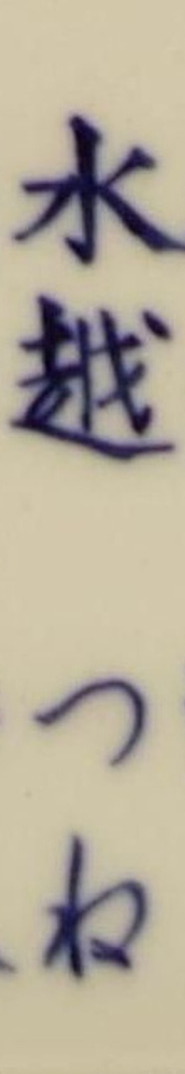水越つね
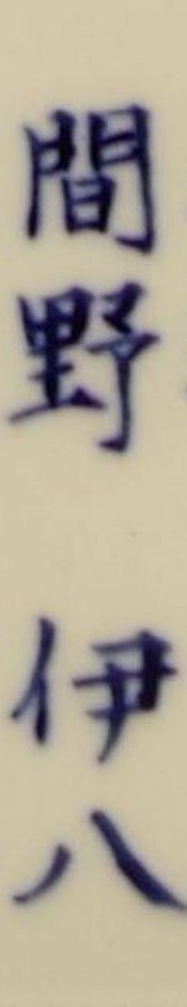間野伊八
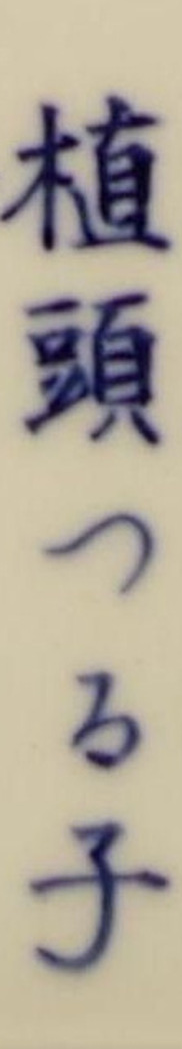植頭つる子
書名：E~L
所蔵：高野山金剛峯寺
